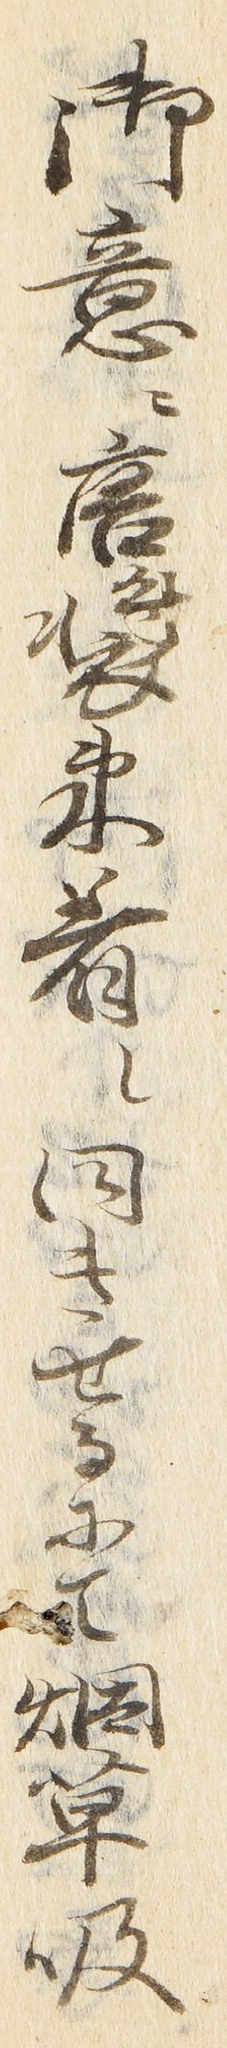御意に唐装束着し同きせるにて烟草吸
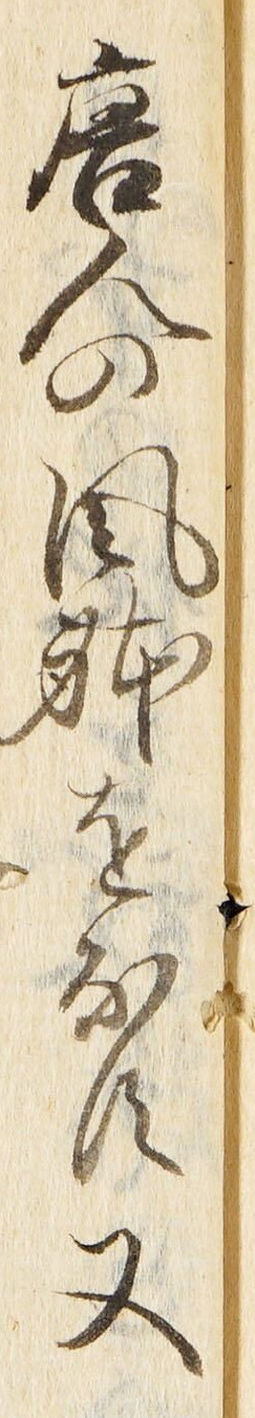唐人の風躰をなす又
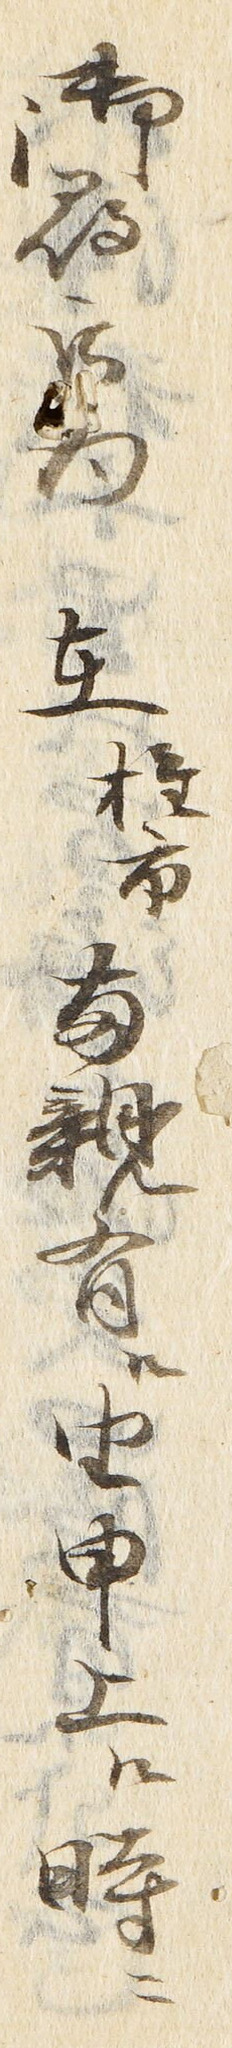御尋被為在権市両親有る由申上る時に
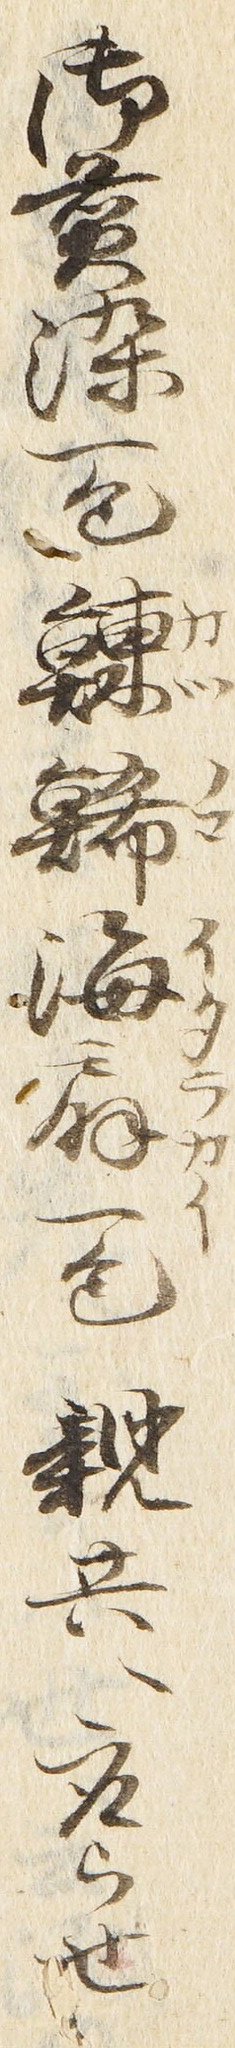御黄染一包鯟鯑海扇一包親共へ取らせ
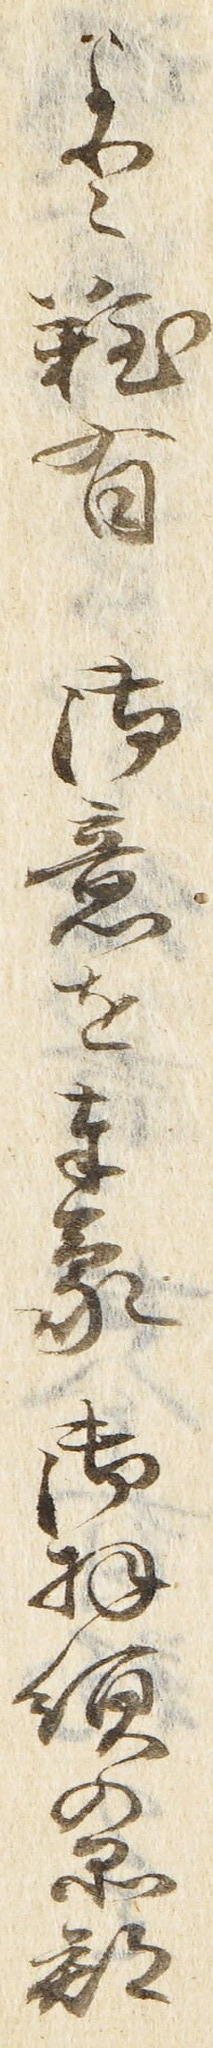より〳〵難有御意を奉蒙御拝すの品郡
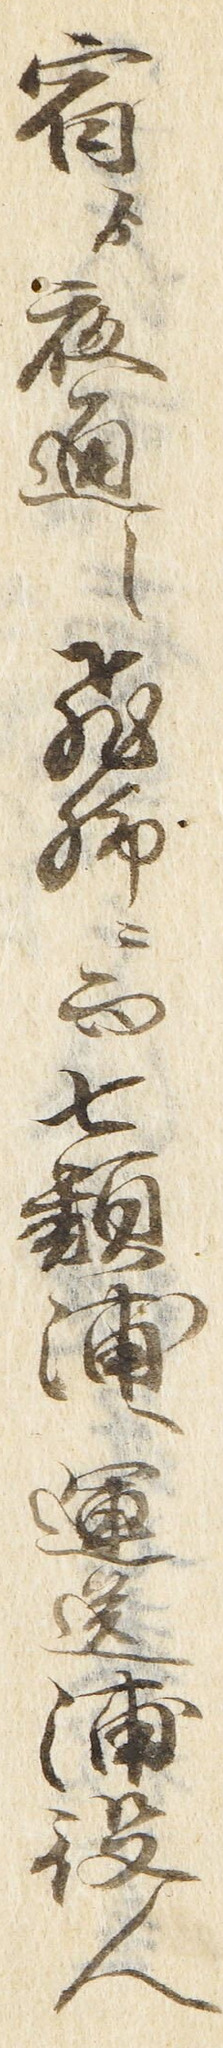宿ゟ夜通し飛却に而七類浦へ運送浦役人
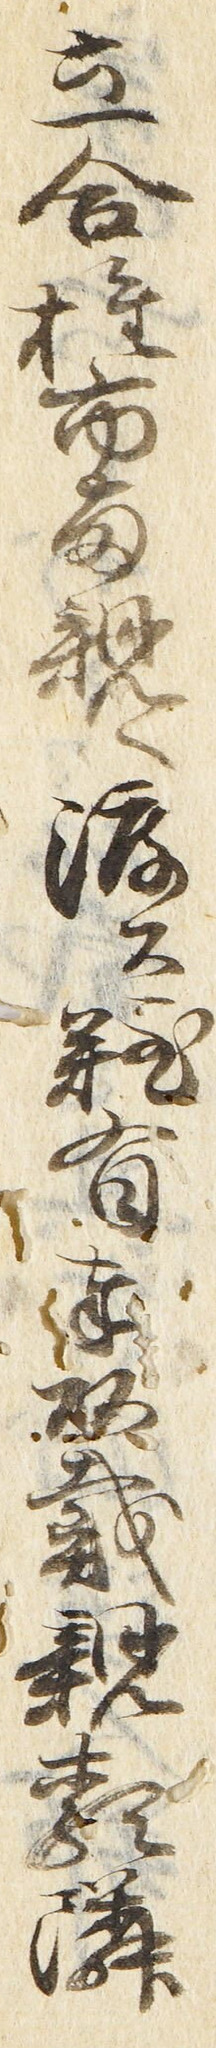立合権市両親へ渡す難有奉頂戴親類隣

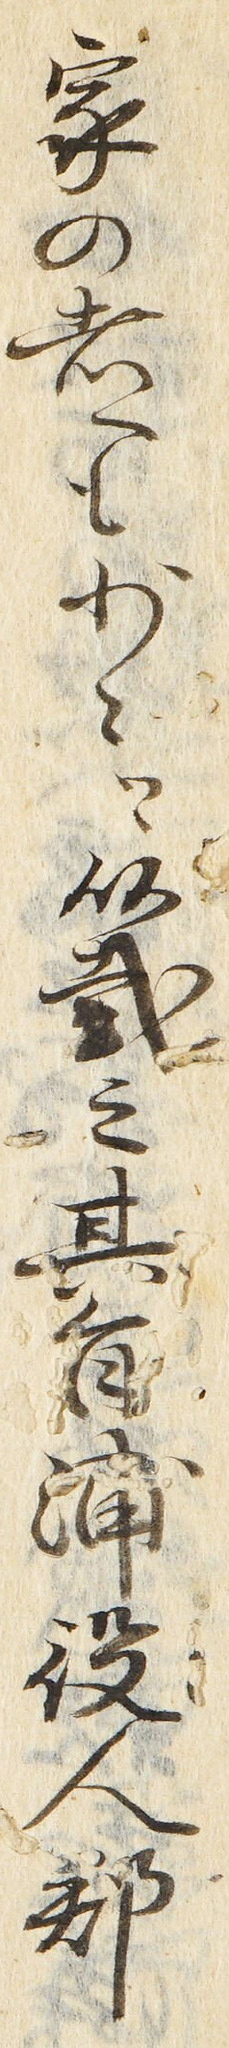家の者へも少々ツヽ頂戴之其旨浦役人郡
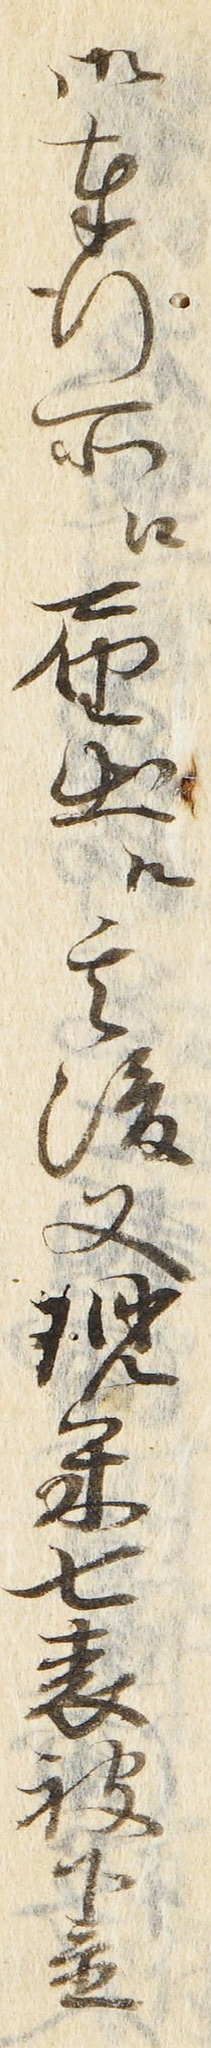御奉行所え届出る其後又現米七表被下置
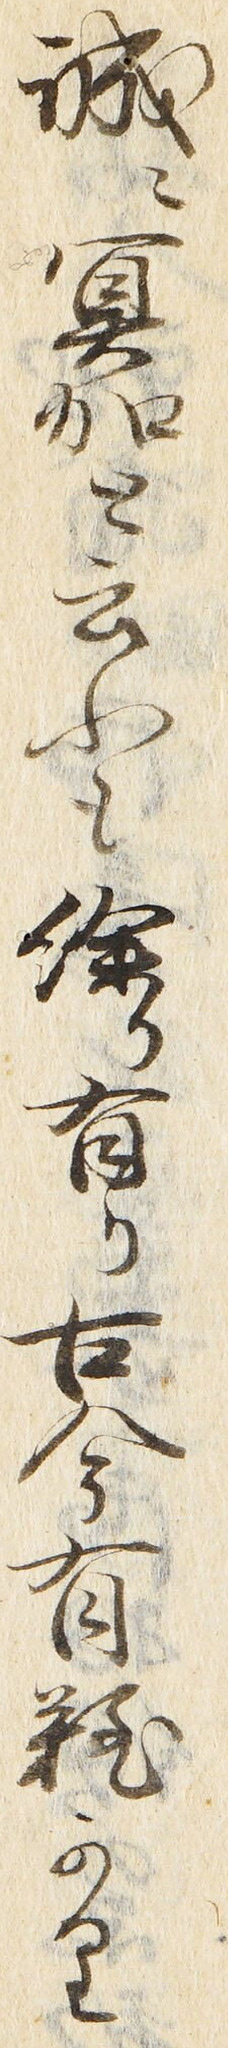誠に冥加と云ふも余り有り古今有難かり
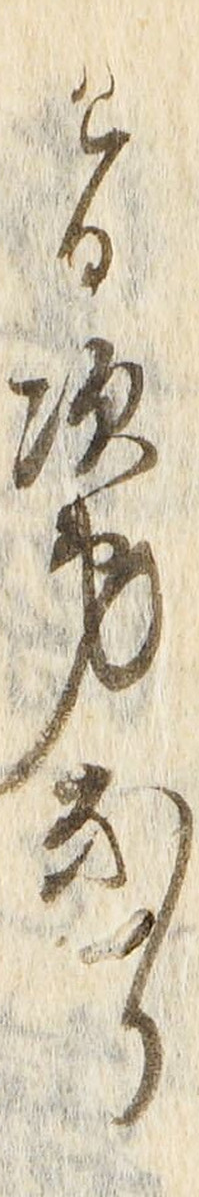ける次第なり
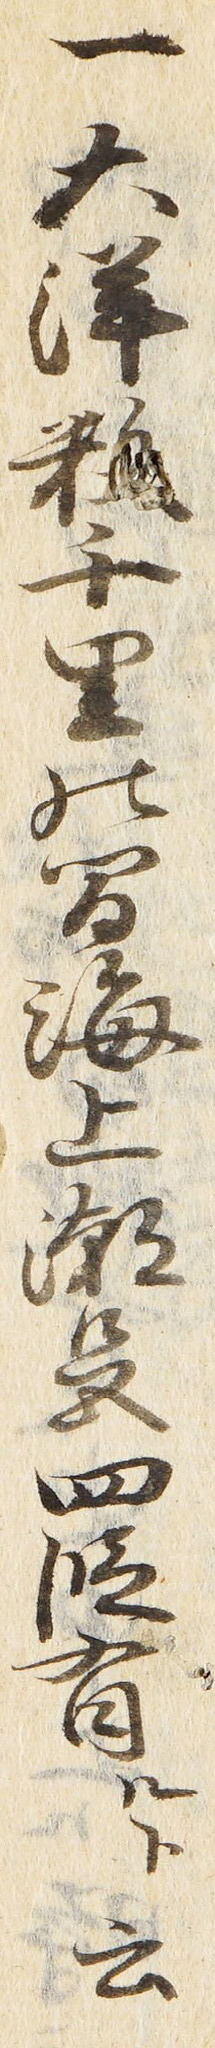一大洋数千里の間海上潮色四段有ると云
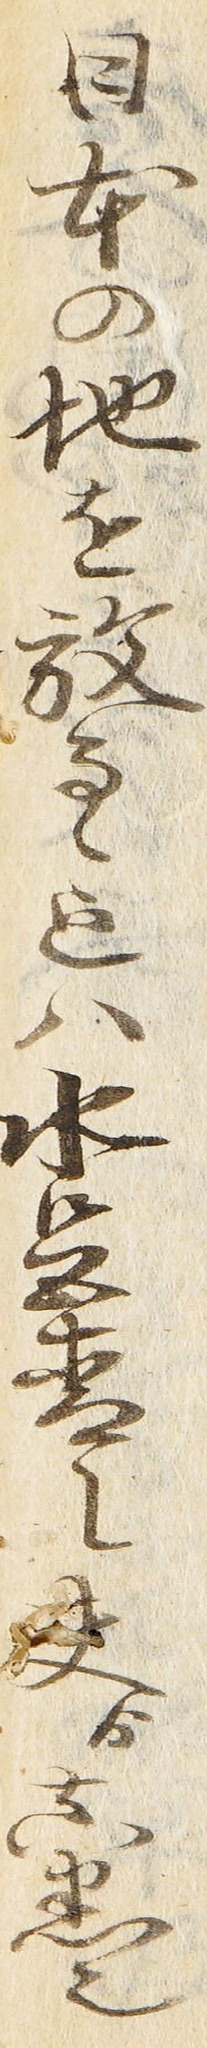日本の地を放るゝ迄は水色青し夫ゟ真黒也
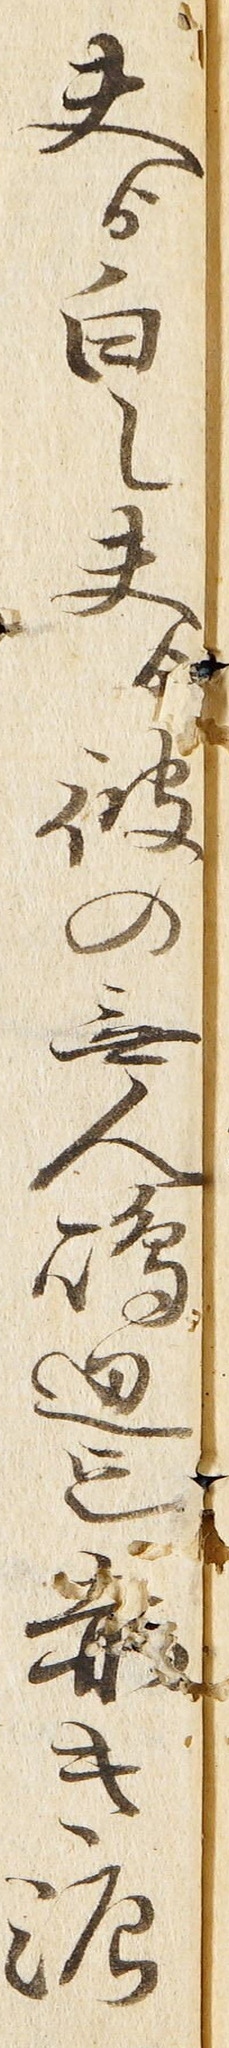夫ゟ白し夫ゟ彼の無人島辺迄赤き泥
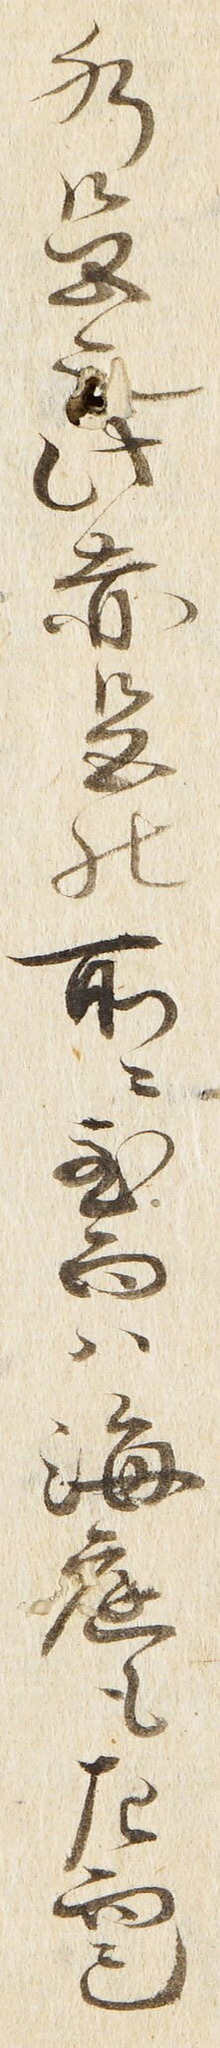水色也此赤色の所に至而は海底も左而己
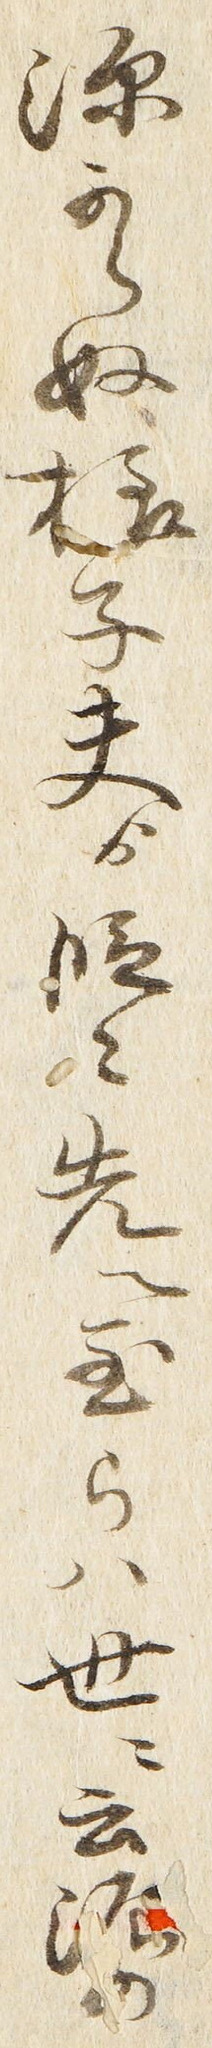深からぬ様子夫ゟ段々先へ至らは世に云泥の
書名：唐物語
